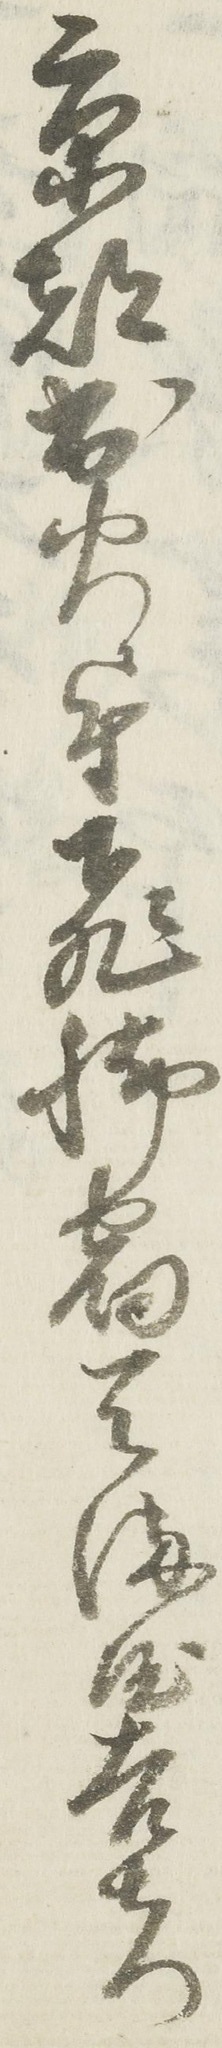京都出火ニ付飛脚宿天海屋吉右衛門
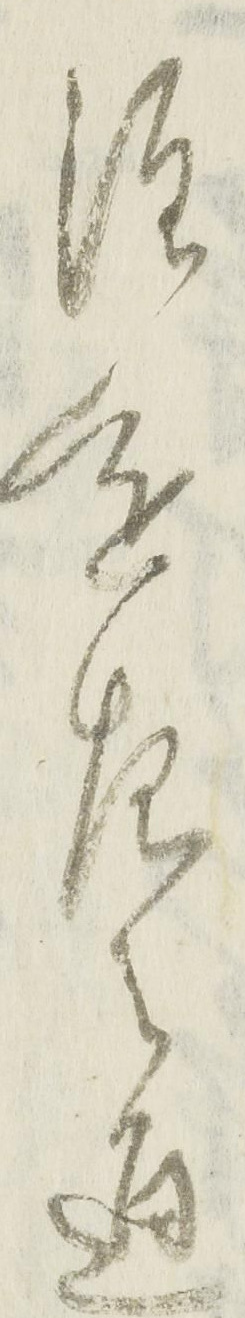注進左之通
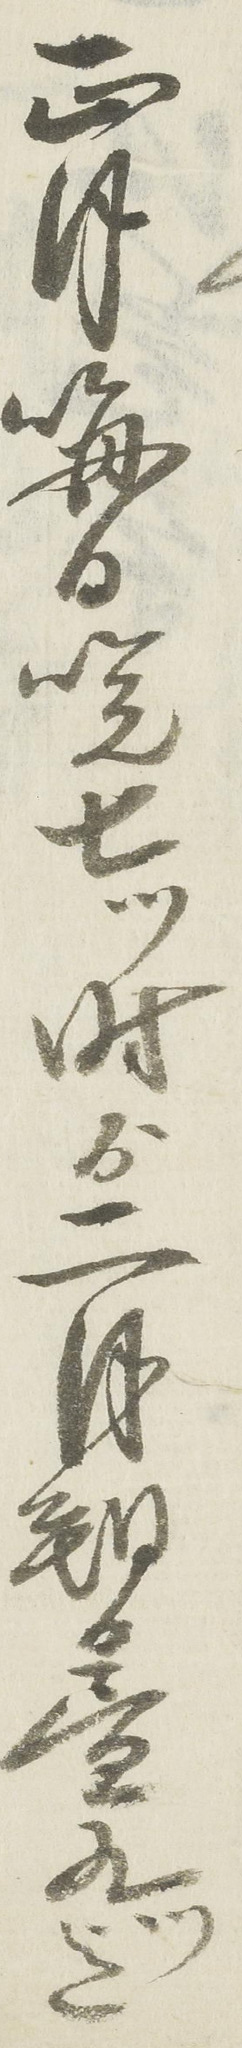正月晦日晩七ツ時ゟ二月朔日昼九ツ迄
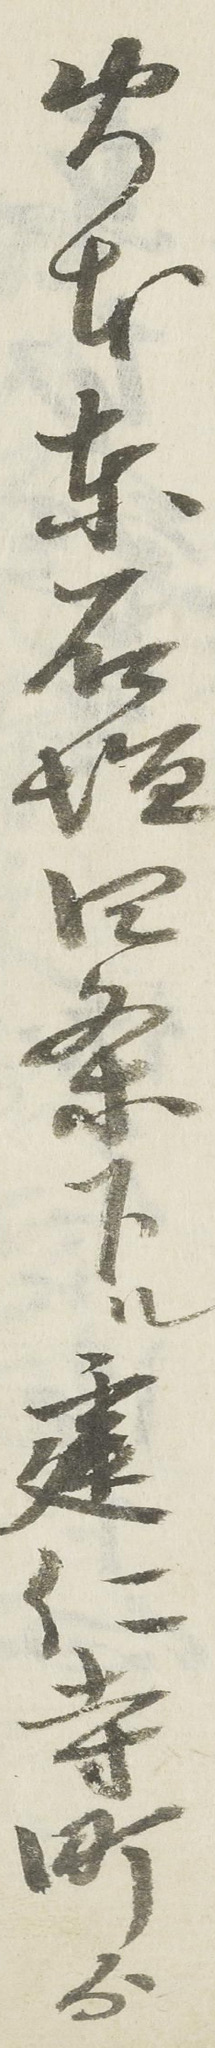火本東石垣四条下ル建仁寺町ゟ
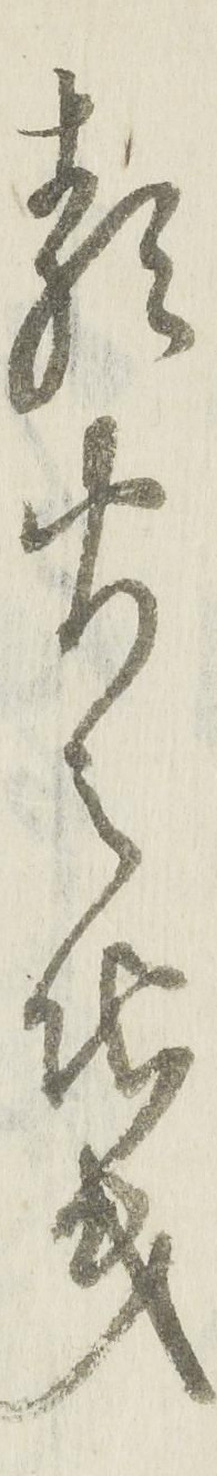類火之仕義
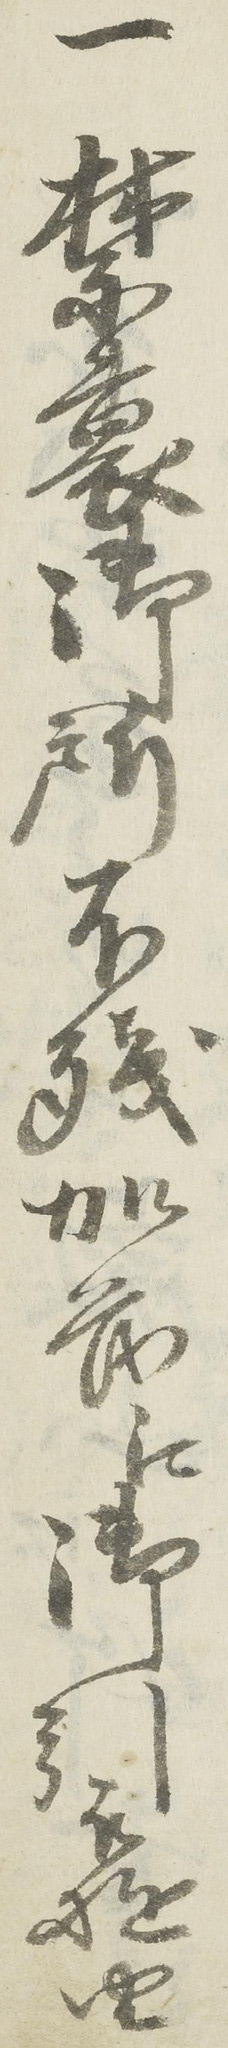一禁裏御所不残加茂え御引被遊由

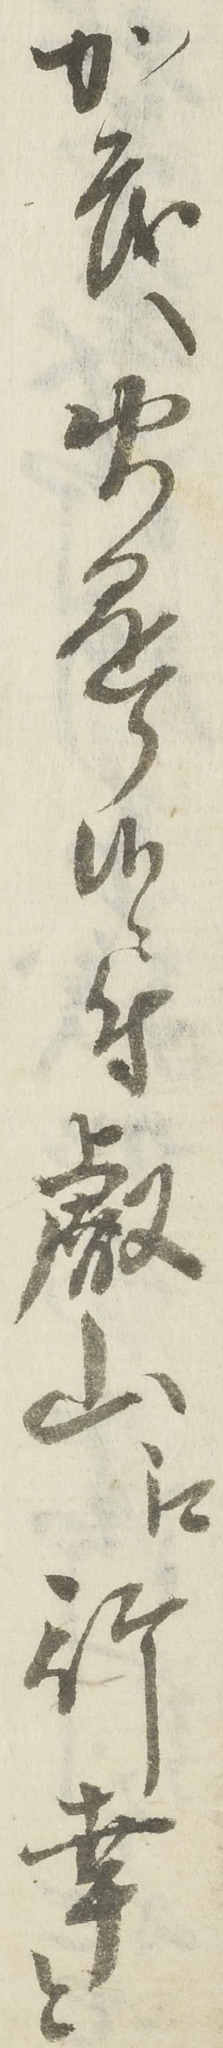加茂へ火懸り候ニ付叡山え行幸と
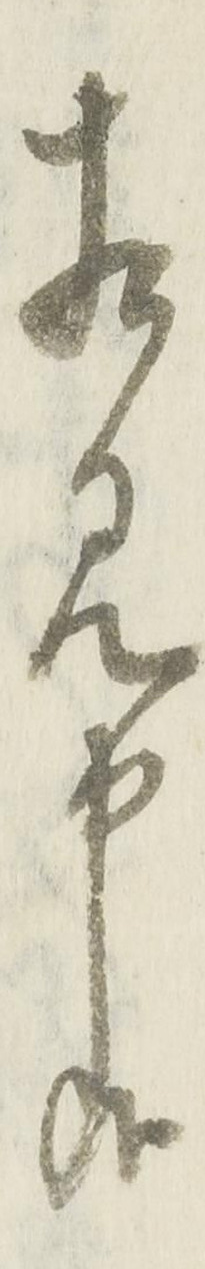相見申候
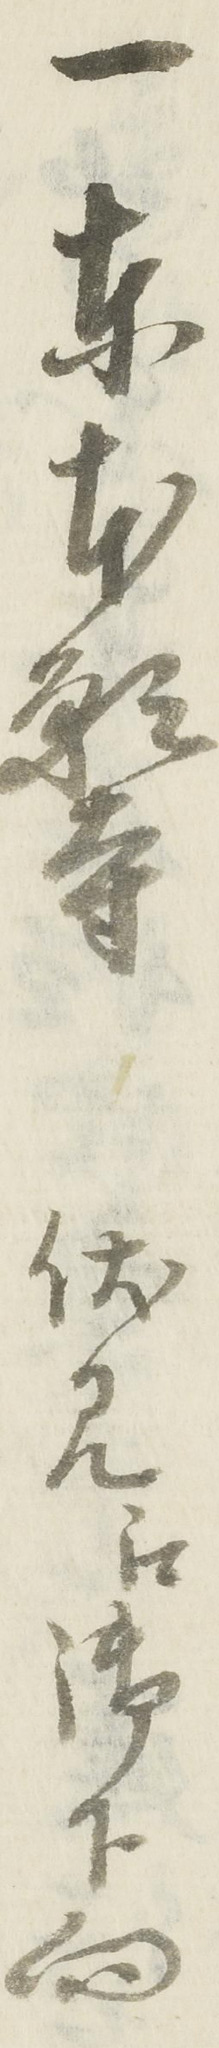一東本願寺伏見え御下向
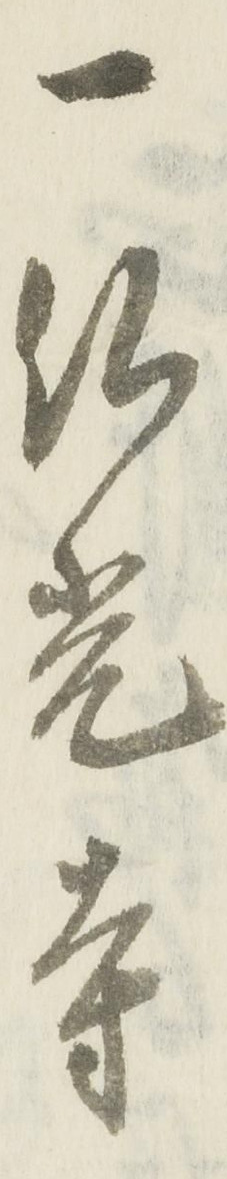一仏光寺
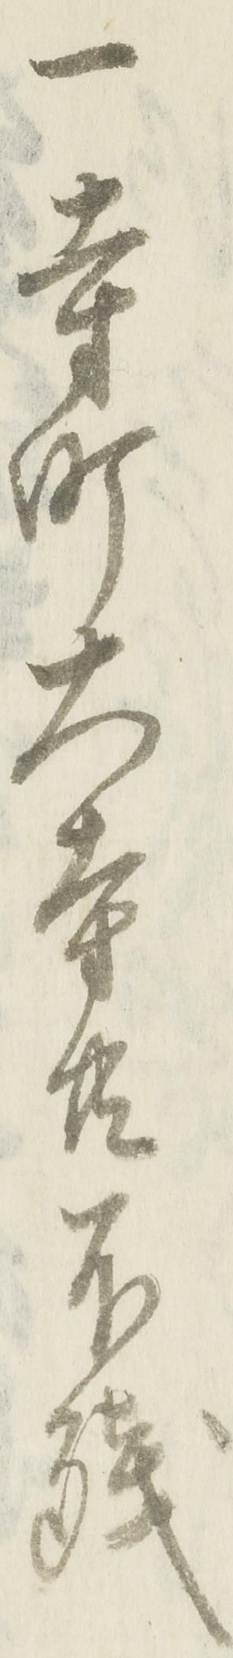一寺町大寺共不残
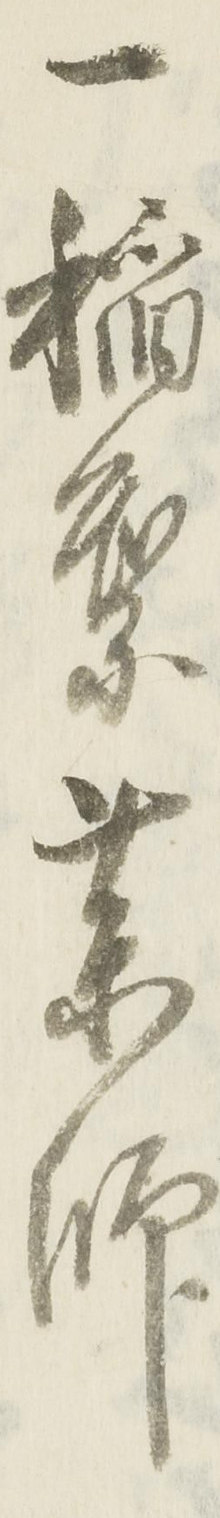一稲葉薬師
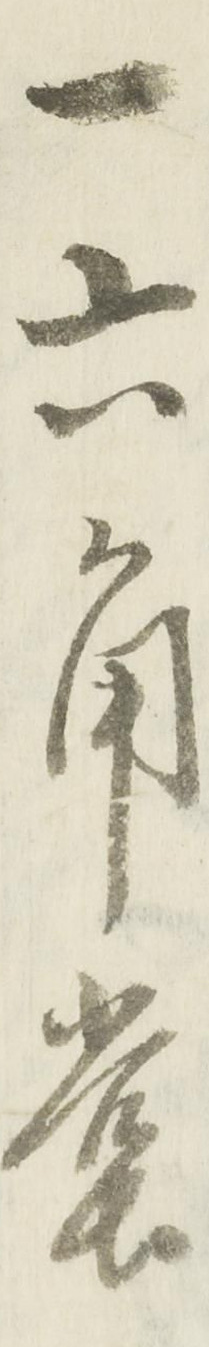一六角堂
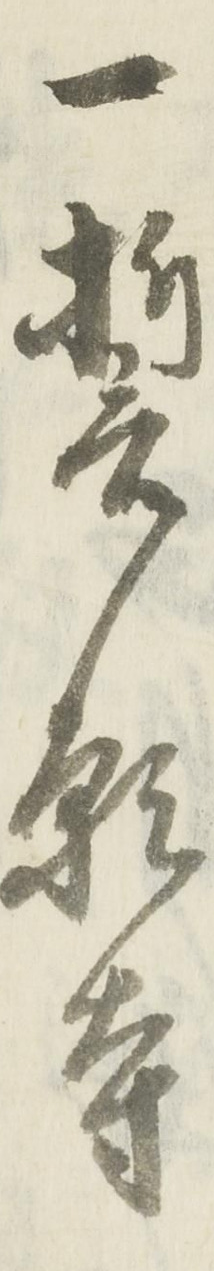一誓願寺
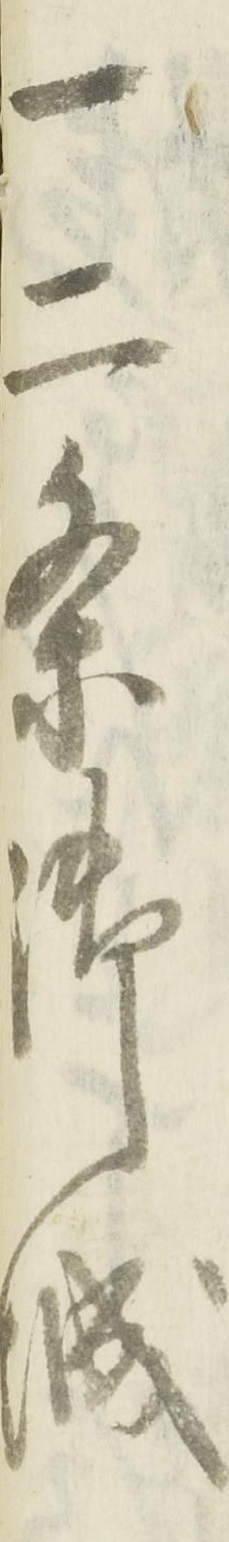一二条御城
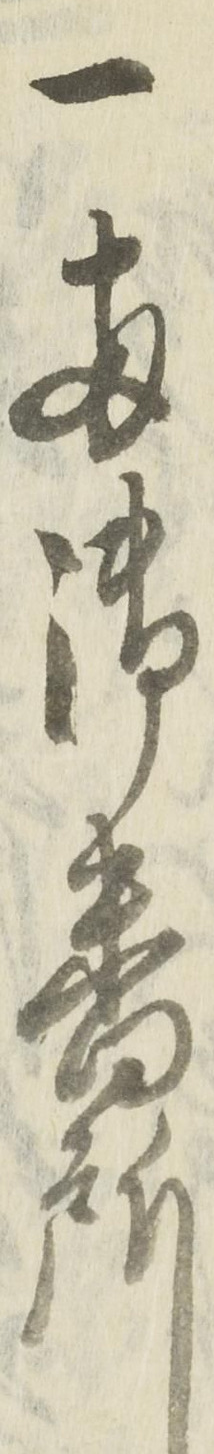一両御番所
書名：後見笑
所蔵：東京大学地震研究所図書室 Earthquake Research Institute Library, The University of Tokyo, JAPAN
